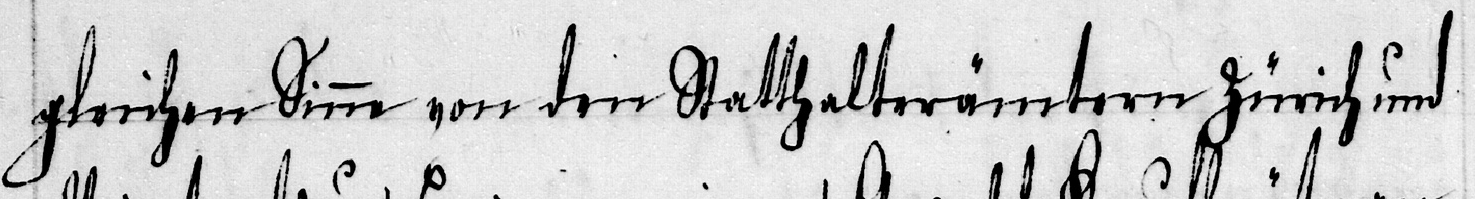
gleichen Sinne von den Statthalterämtern Zürich und
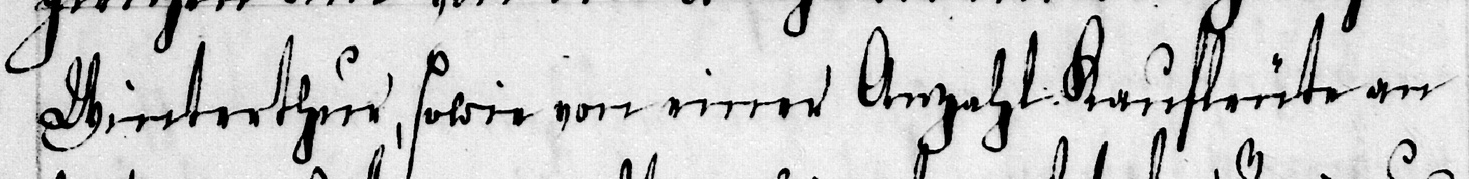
Winterthur, sowie von einer Anzahl Kaufleute an
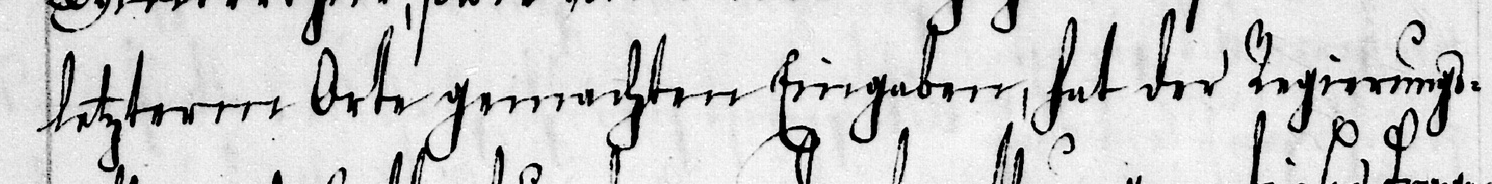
letzterm Orte gemachten Eingaben, hat der Regierung¬
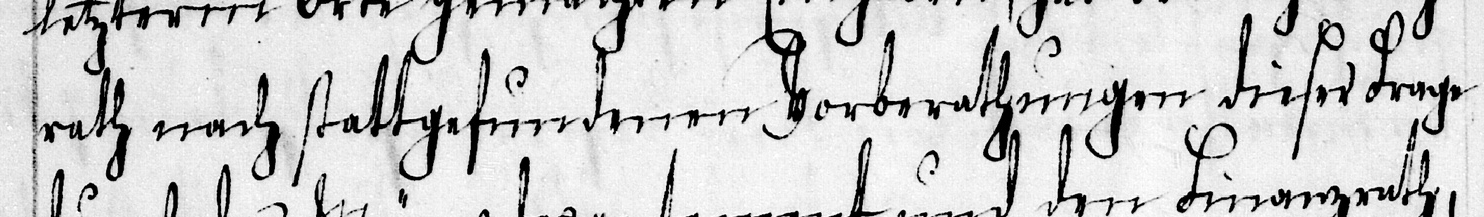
srath nach stattgefundenen Vorberathungen dieser Frage
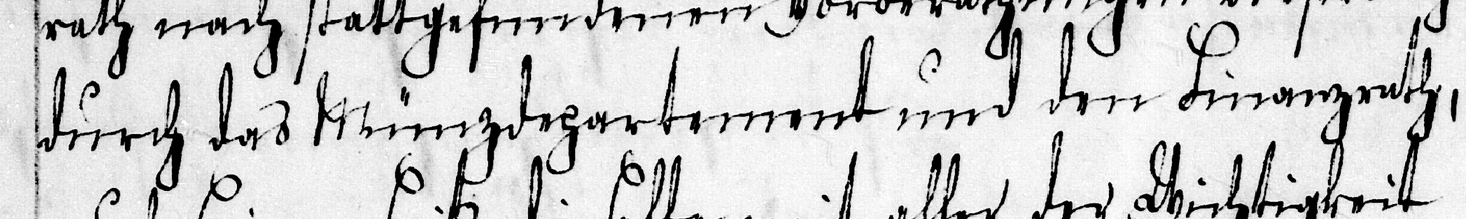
durch das Münzdepartement und den Finanzrath,
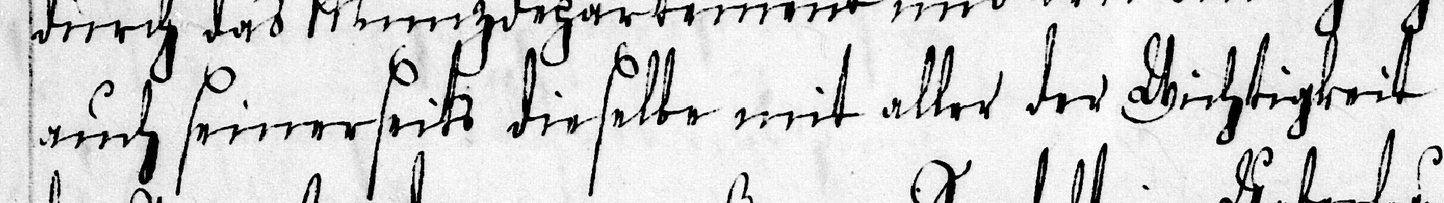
auch seinerseits dieselbe mit aller der Wichtigkeit
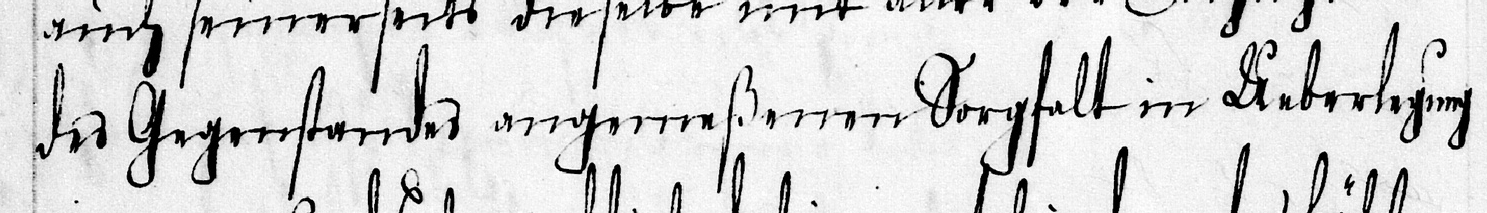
des Gegenstandes angemeßenen Sorgfalt in Ueberlegung
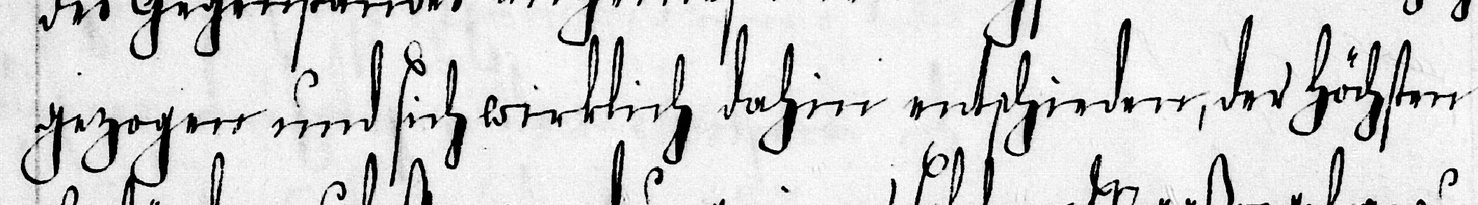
gezogen und sich wirklich dahin entschieden, der Höchsten
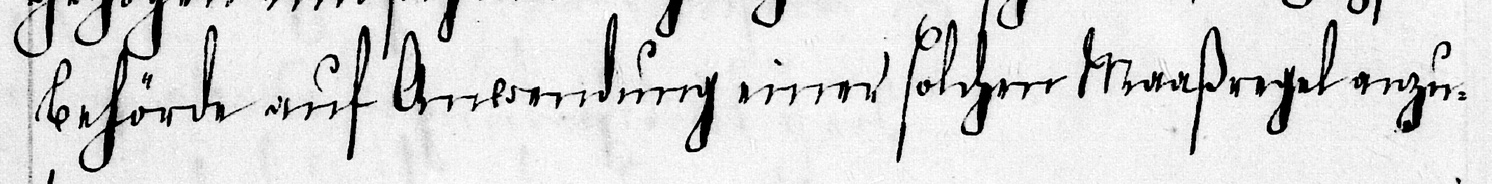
Behörde auf Anwendung einer solchen Maaßregel anzu¬
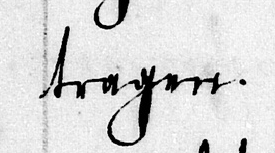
tragen.
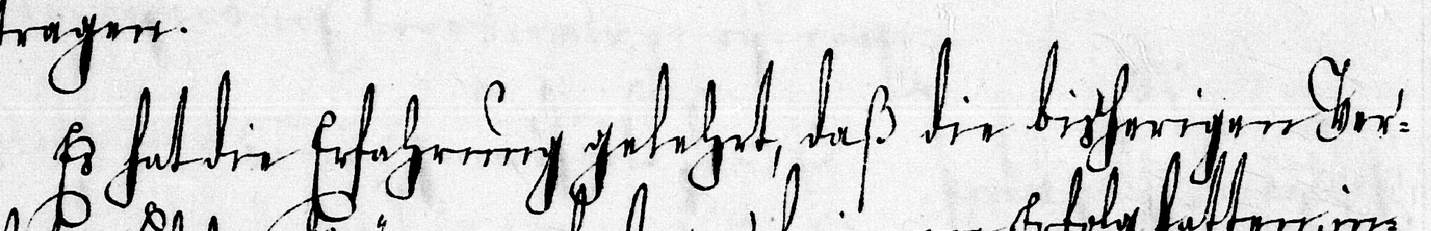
Es hat die Erfahrung gelehrt, daß die bisherigen Ver¬
